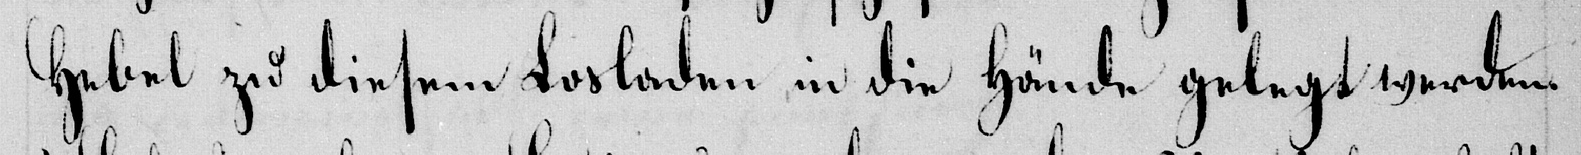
Hebel zu diesem Losladen in die Hände gelegt werden.
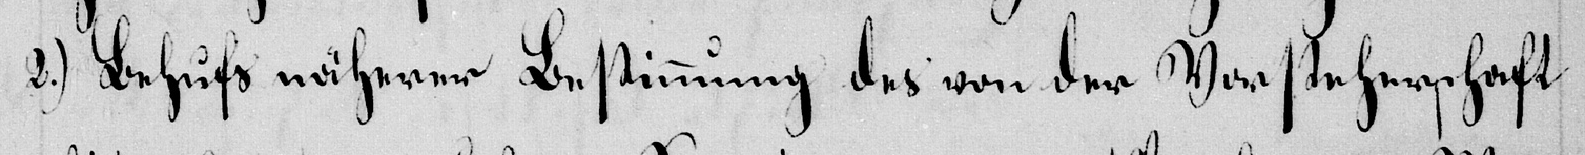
2.) Behufs näherer Bestimmung des von der Vorsteherschaft
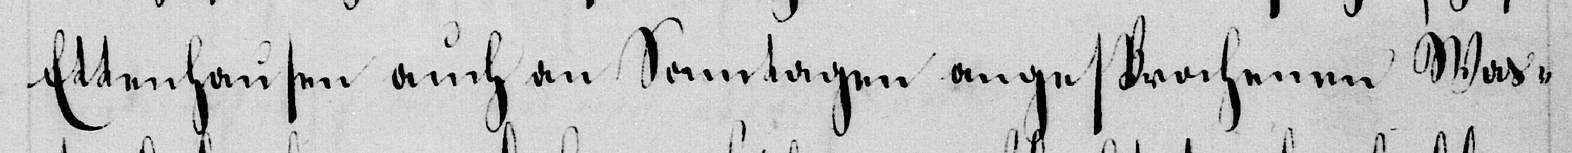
Ettenhausen auch an Sonntagen angesprochenen Waß¬
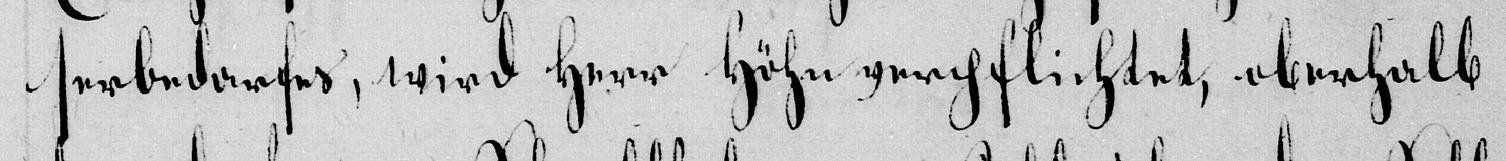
erbedarfes, wird Herr Höhn verpflichtet, oberhalb
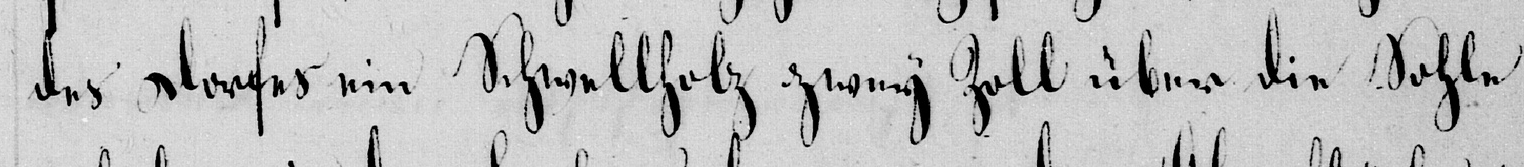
des Dorfes ein Schwellholz zwey Zoll über die Sohle
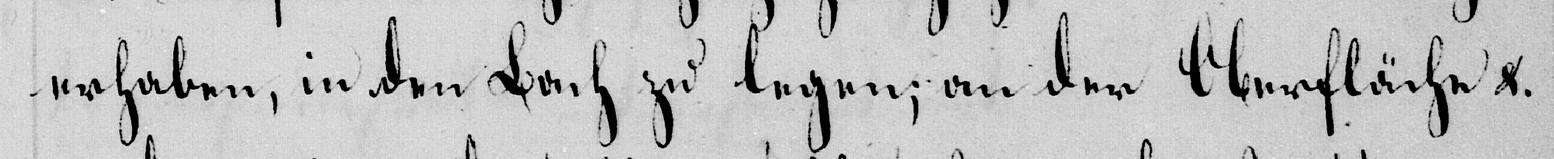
erhaben, in den Bach zu legen; an der Oberfläche &.
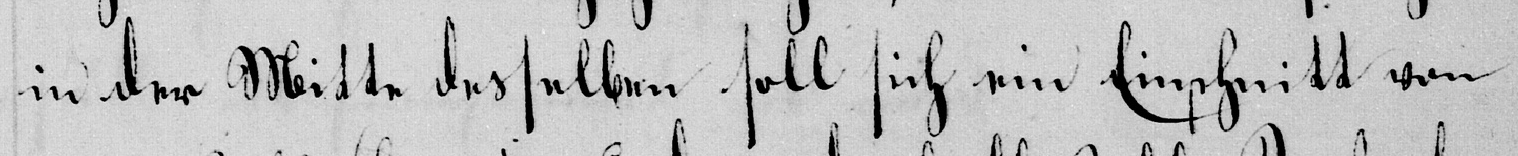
in der Mitte desselben soll sich ein Einschnitt von
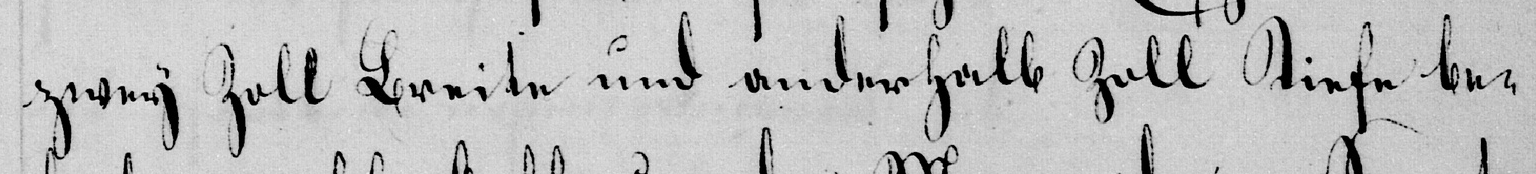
zwey Zoll Breite und anderhalb Zoll Tiefe be¬
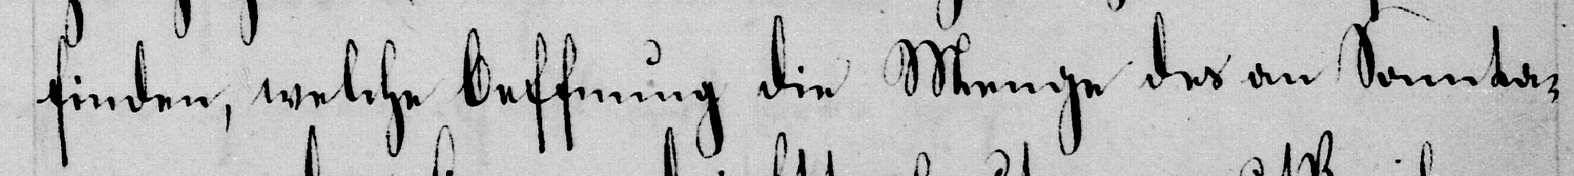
finden, welche Oeffnung die Menge des an Sonnta¬
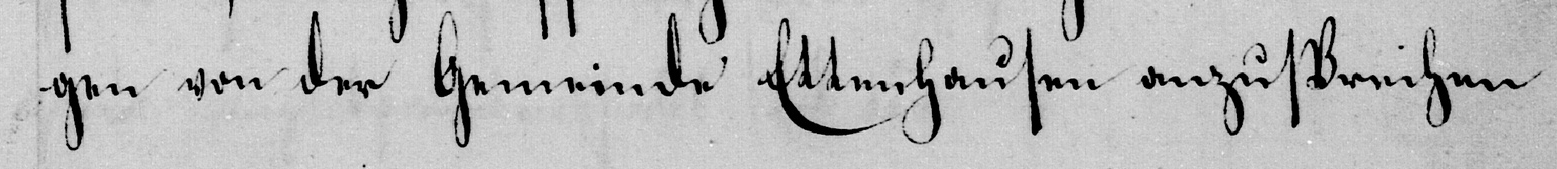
gen von der Gemeinde Ettenhausen anzusprechen
